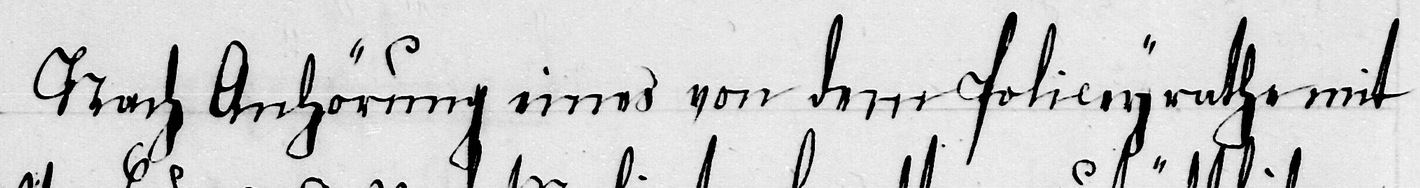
Nach Anhörung eines von dem Policeyrathe mit
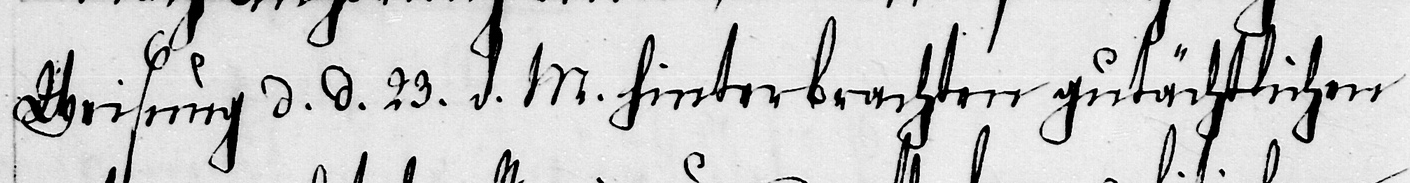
Weisung d. d. 23. d. M. hinterbrachten gutächtlichen
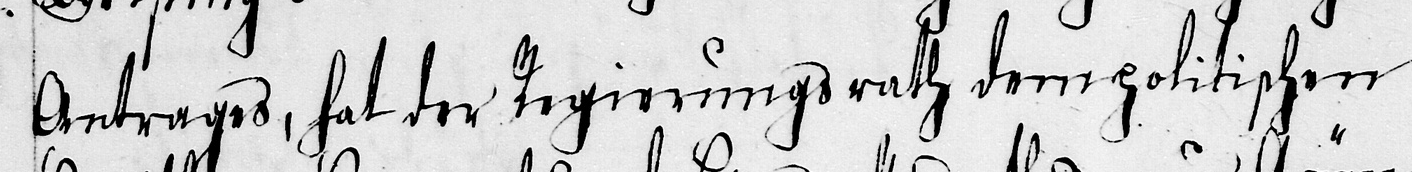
Antrages, hat der Regierungsrath dem politischen
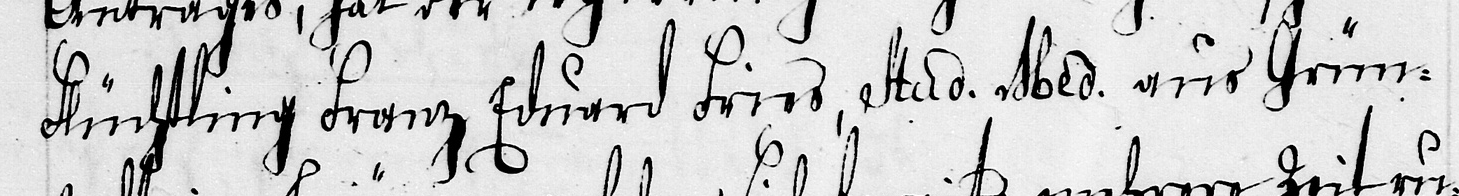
Flüchtling Franz Eduard Fries, Stud. Med. aus Grün¬
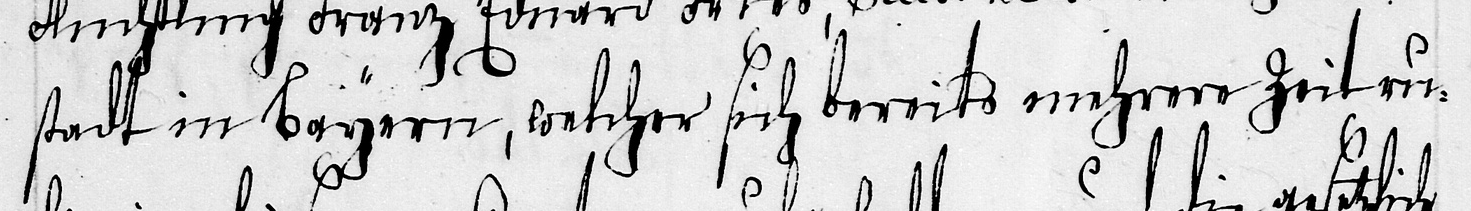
stadt in Bayern, welcher sich bereits mehrere Zeit ru¬
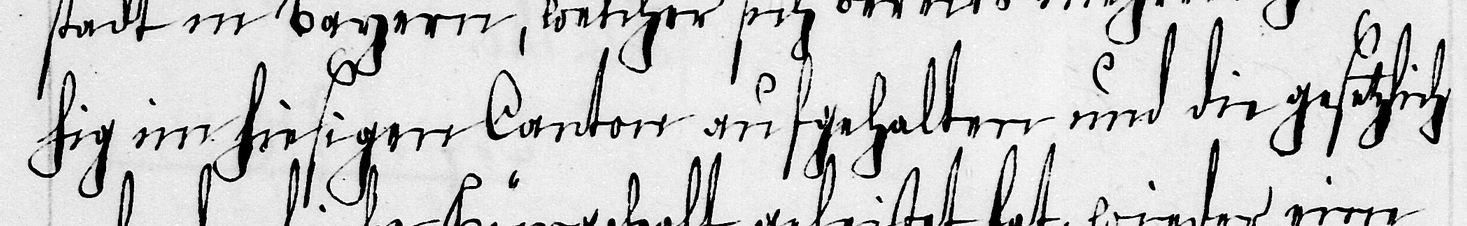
hig im hiesigen Canton aufgehalten und die gesetzli¬
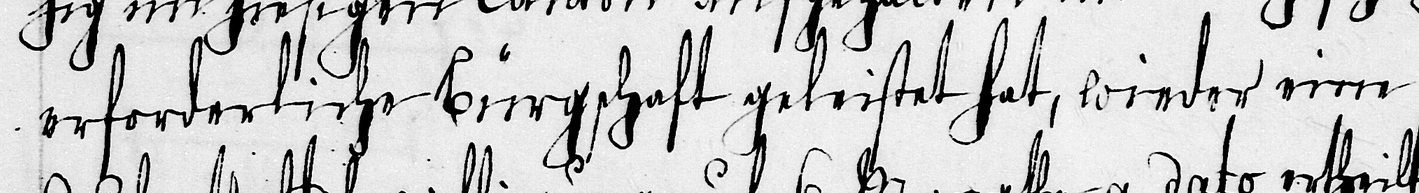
erforderliche Bürgschaft geleistet hat, wieder eine
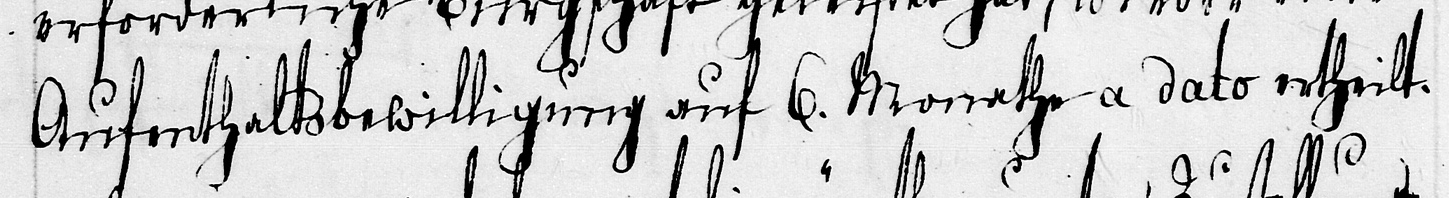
Aufenthaltsbewilligung auf 6. Monathe a dato ertheilt.
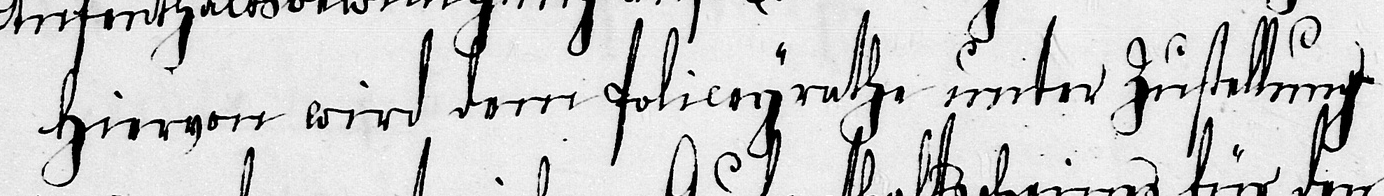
Hiervon wird dem Policeyrathe unter Zustellung
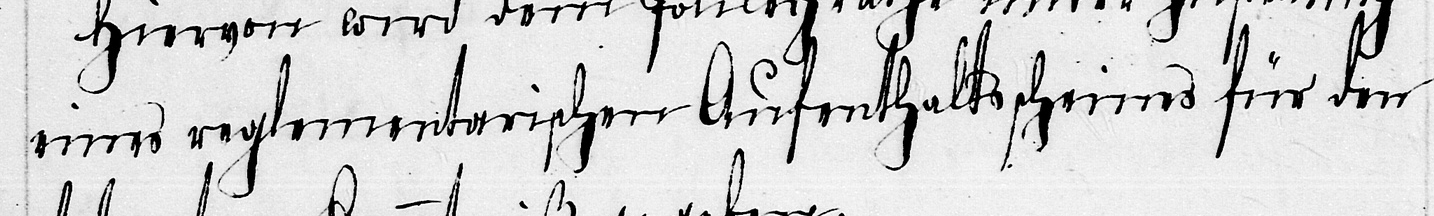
eines reglementarischen Aufenthaltsscheines für den
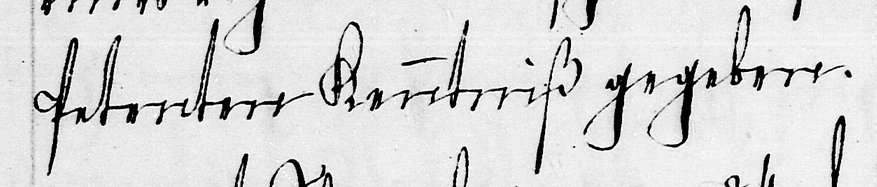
Petenten Kenntniß gegeben.
